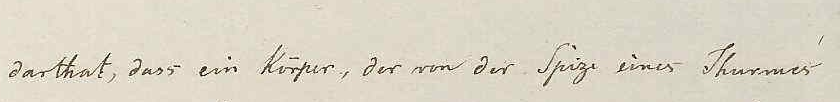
darthat, dass ein Körper, der von der Spize eines Thurmes
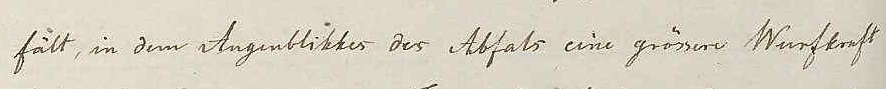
fält, in dem des Abfals eine grössere Wurfkraft
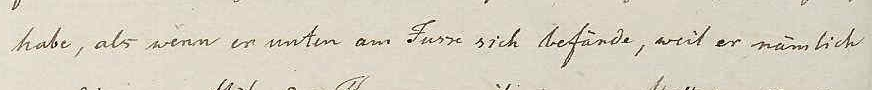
habe, als wenn er unten am Fusse sich befände, weil er nämlich
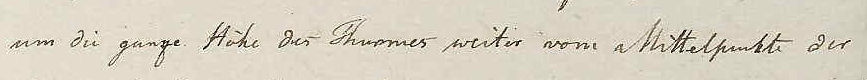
um die ganze Höhe des Thurmes weiter vom Mittelpunkt der
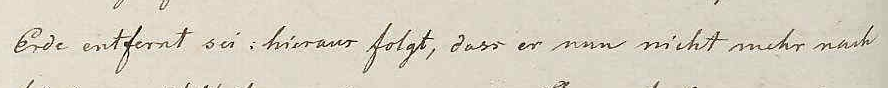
Erde entfernt sei: hieraus folgt, dass er nun nicht mehr nach
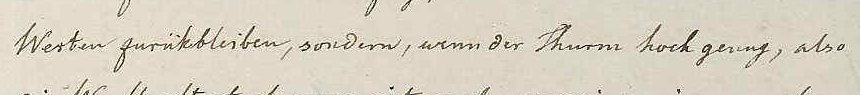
Westen zurükbleiben, sondern, wenn der Thurm hoch genug, also
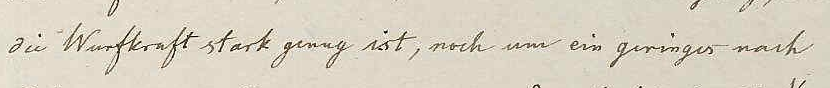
die Wurfkraft stark genug ist, noch um ein geringes nach
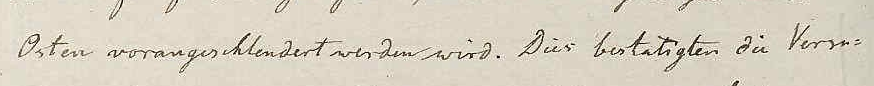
Osten vorangeschleudert werden wird. Dies bestätigten die Versu-
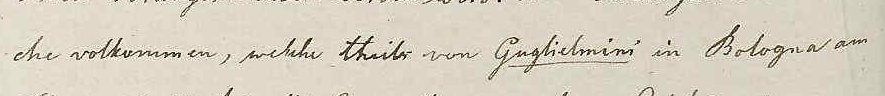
che volkommen, welche theils von Guglielmini in Bologna am
